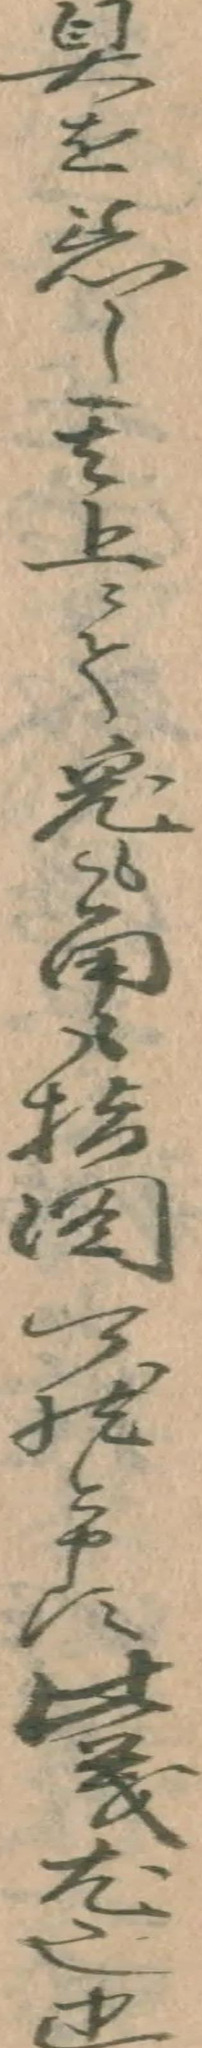具を着し其上にて兎も角も指図可然と申す此義尤也迚
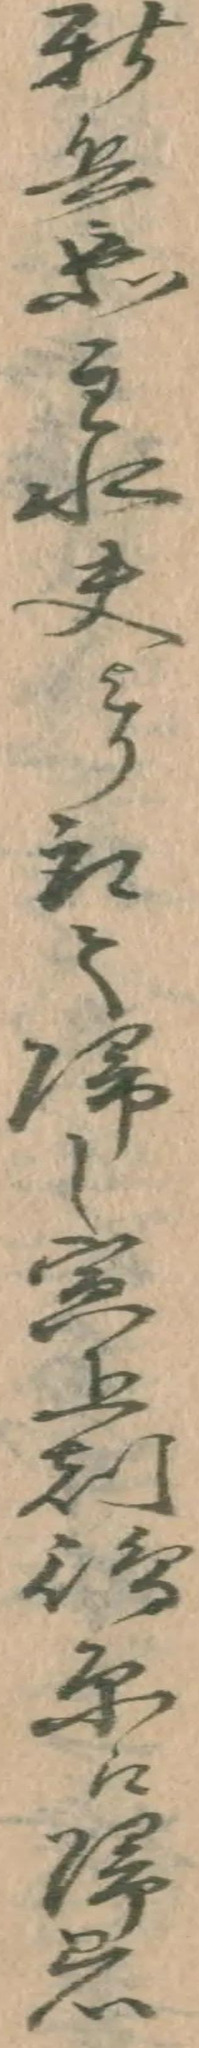新兵衛主水夫より取て帰し寅上刻島原え帰着
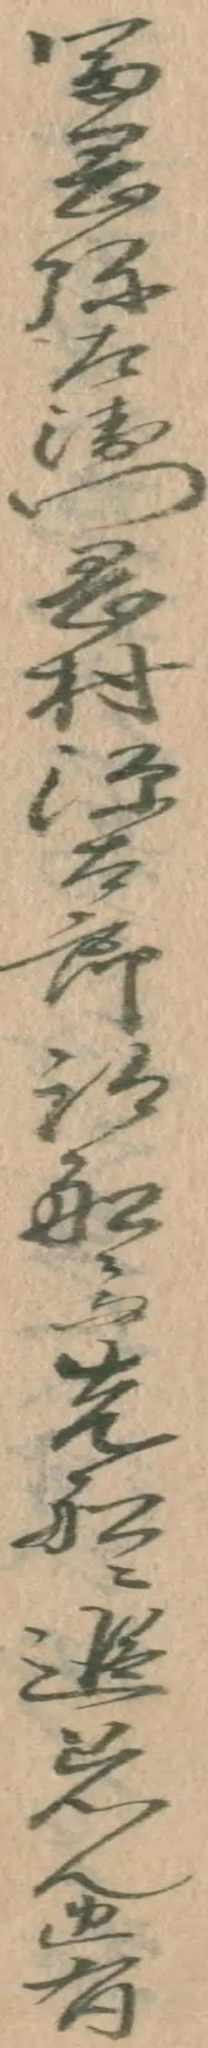富岡弥左衛門岡村源太郎跡船に而先船に追着ん迚有
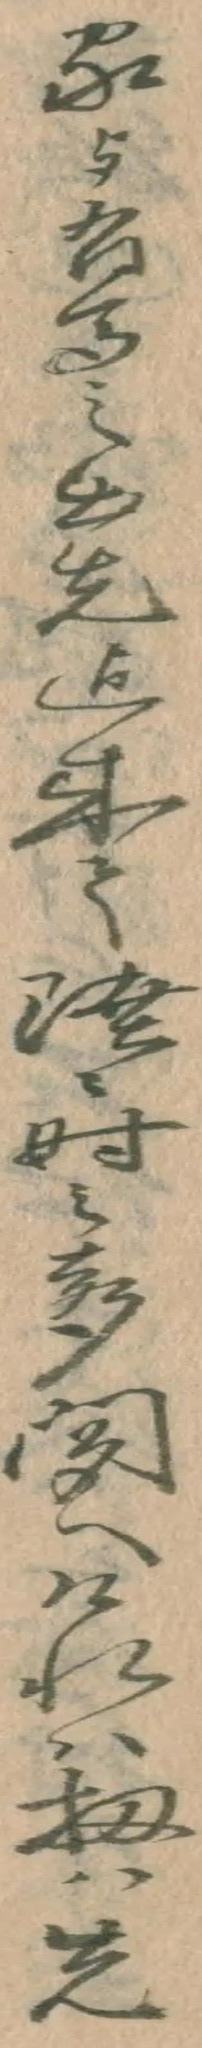家与有馬之出先迄来て陸に時之声聞へけれは扨は先
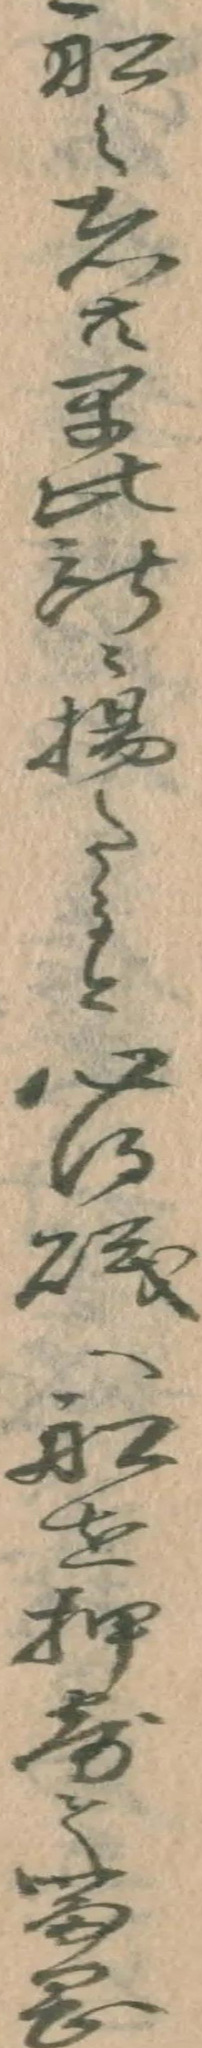船之者共早此所に揚たると心得磯へ船を押寄て富岡
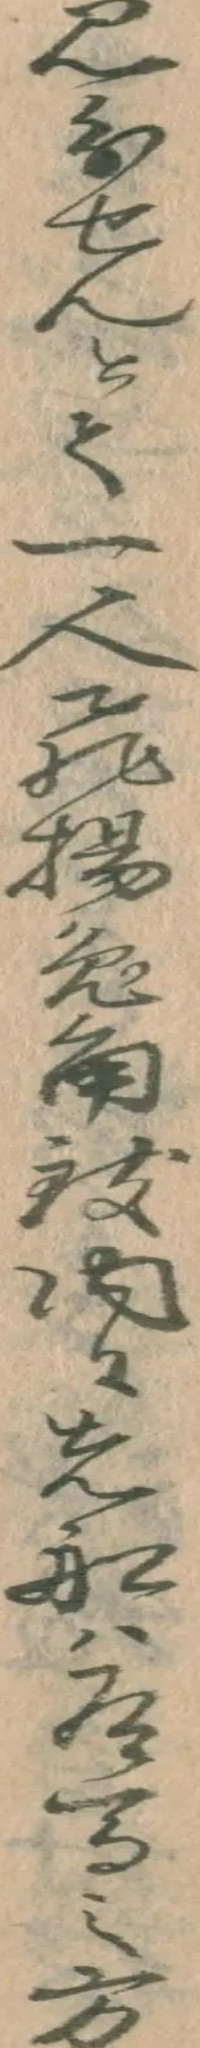見分せんとて一人飛揚兎角致内に先船は有馬之方
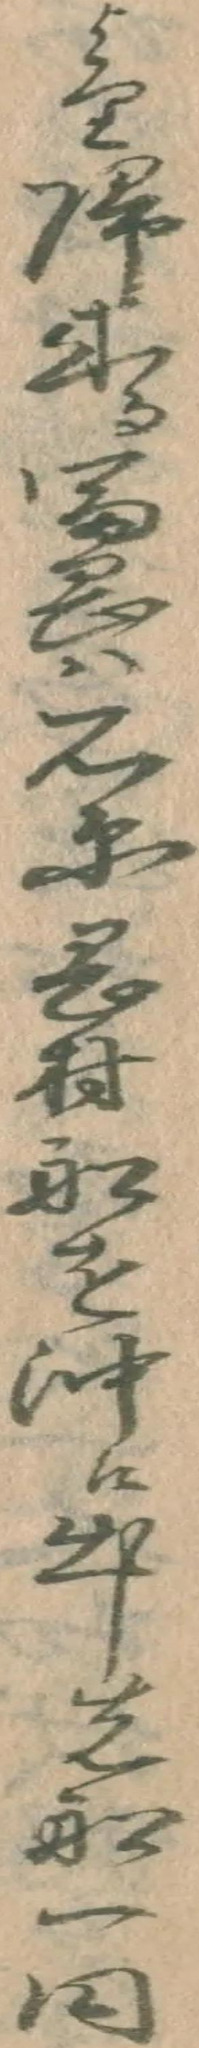より帰来る富岡は石原岡村船を沖え出し先船一同
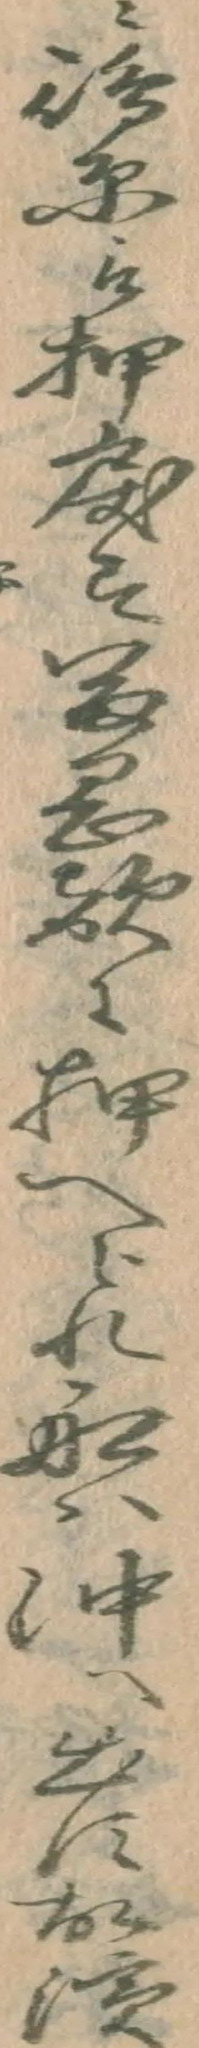に島原え押戻す富岡敵に押へられ船は沖へ出す故浜
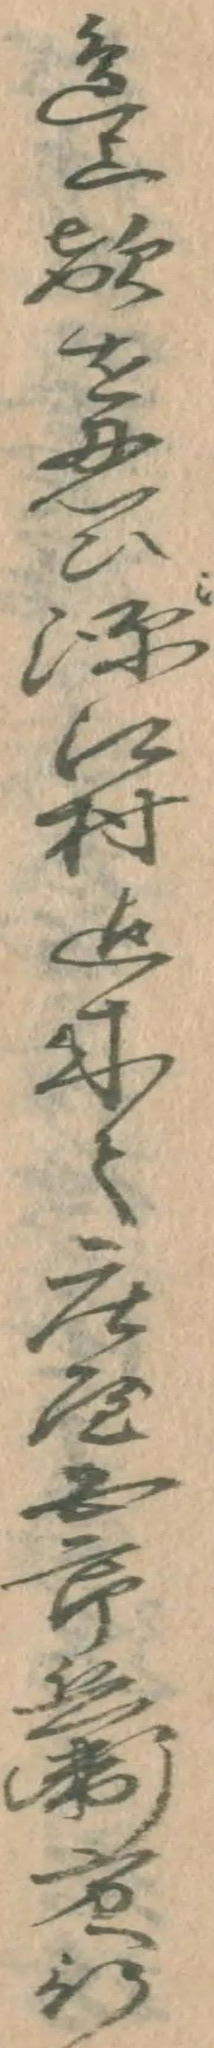辺迄敵を忍ひ深江村迄来て庄屋五郎兵衛方へ行
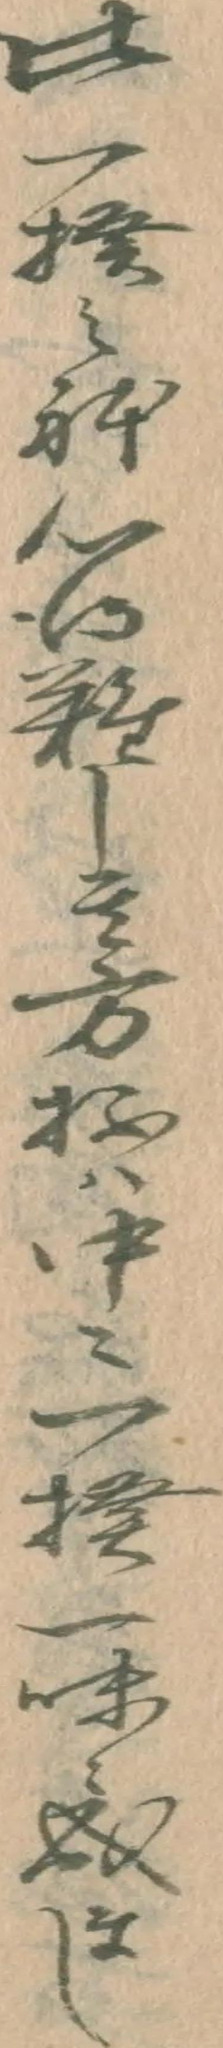此一揆之体心得難し其方様は中々一揆一味に成まし

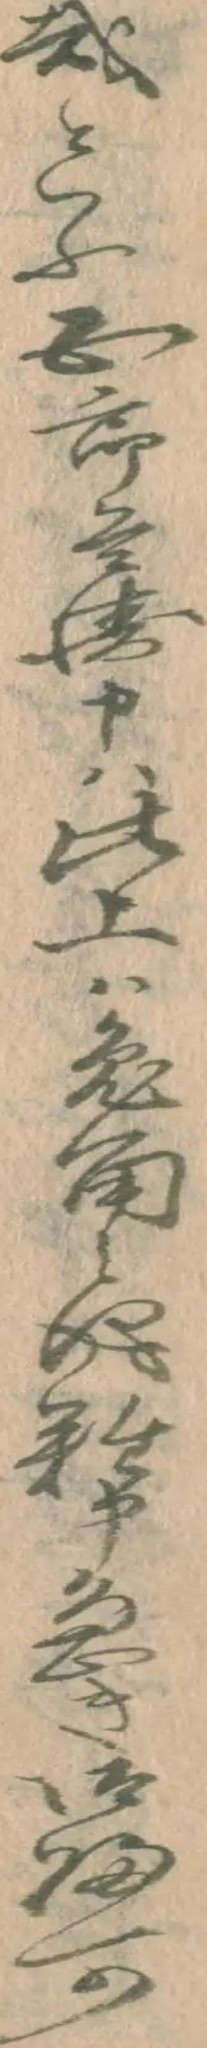哉といふ五郎兵衛申は此上は兎角之儀難申急き御帰可
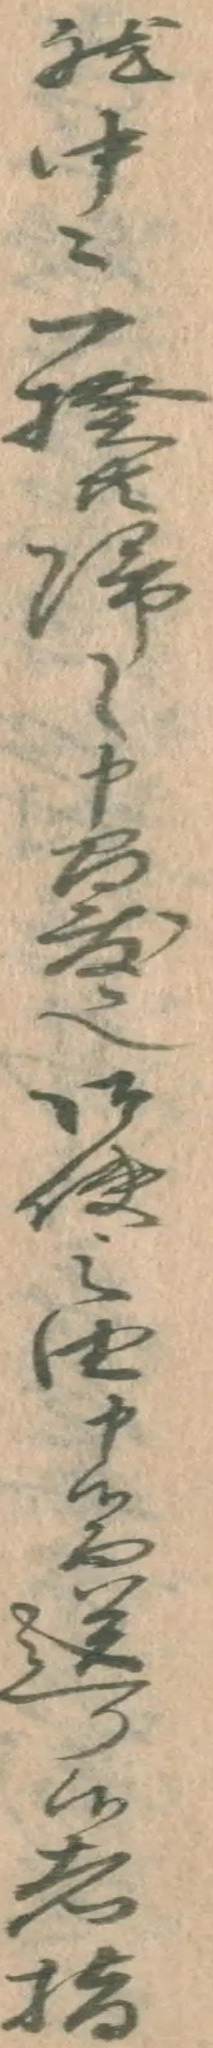然中々一揆共帰し申間敷也御使之由申候而送り候者指
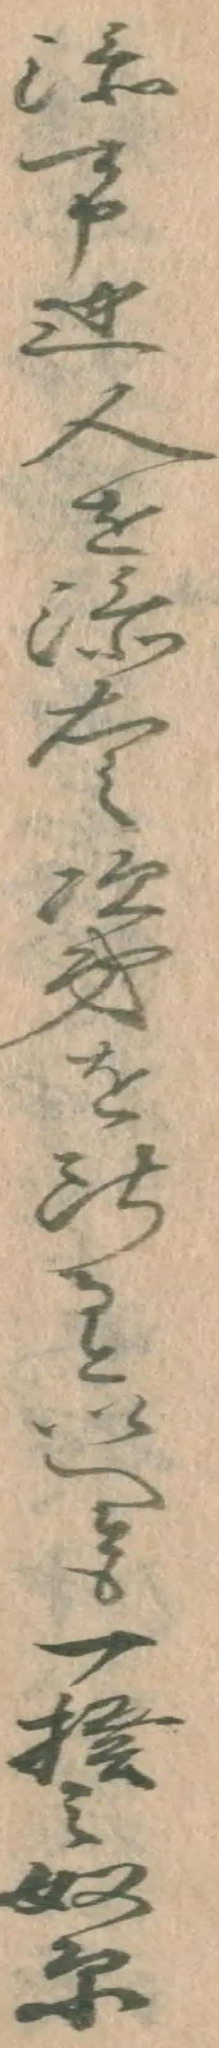添可申迚人を添右之次第を断るといへとも一揆之奴原
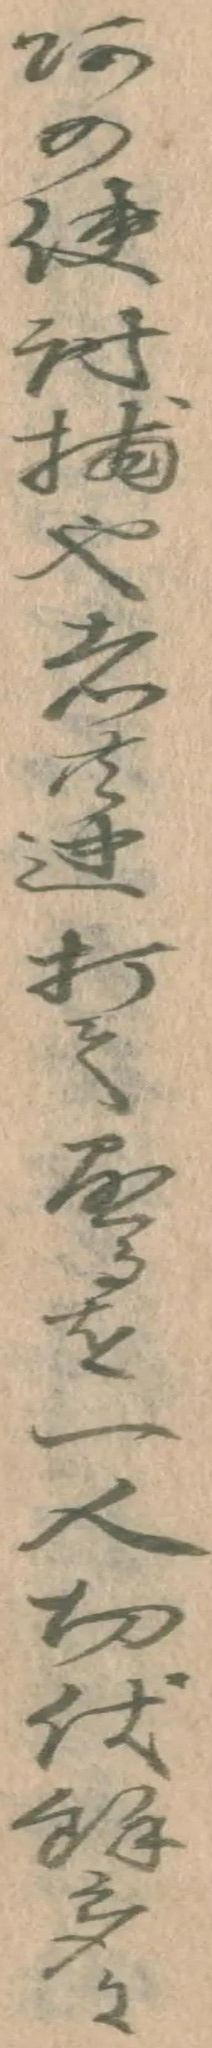あの使討捕や者共迚打て懸るを一人切伏余多に
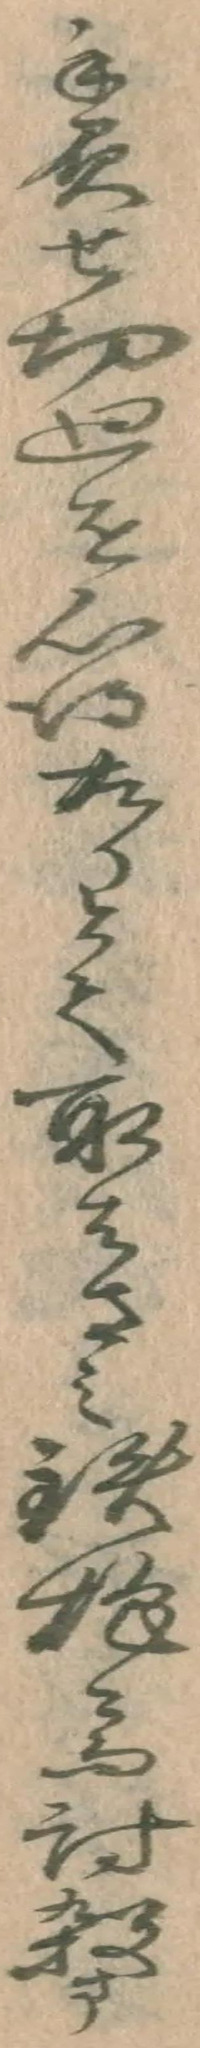手負せ切廻を心得たりとて取はさみ鉄炮に而討殺す
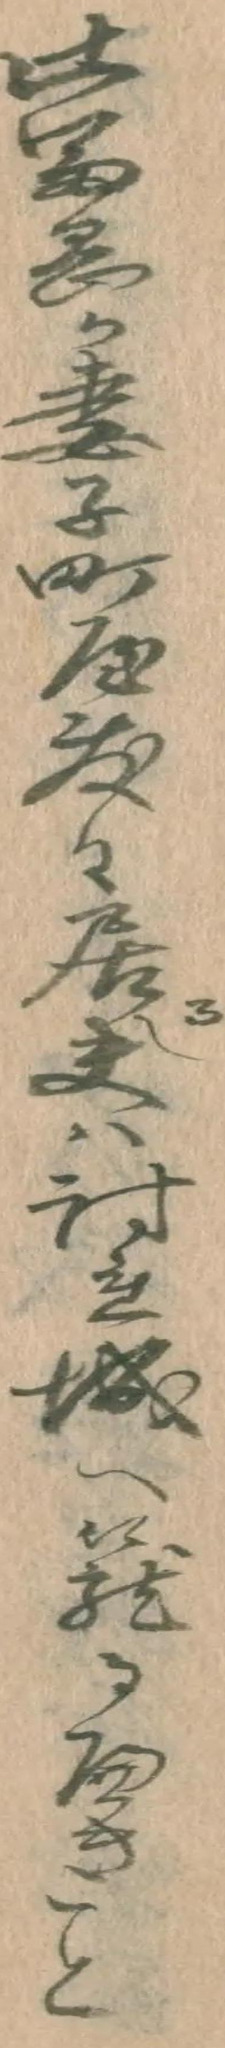此富岡か妻子町屋敷に居る夫は討れ城へ籠るへきこと
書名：切支丹御退治記 49巻. [1]
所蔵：国立国会図書館 National Diet Library, JAPAN
